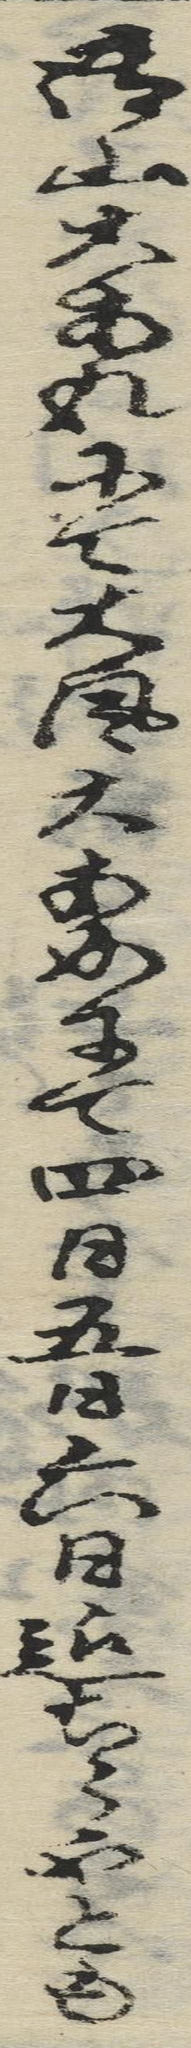御山大あれにて大風大あめにて四日五日六日迄ちうやとも
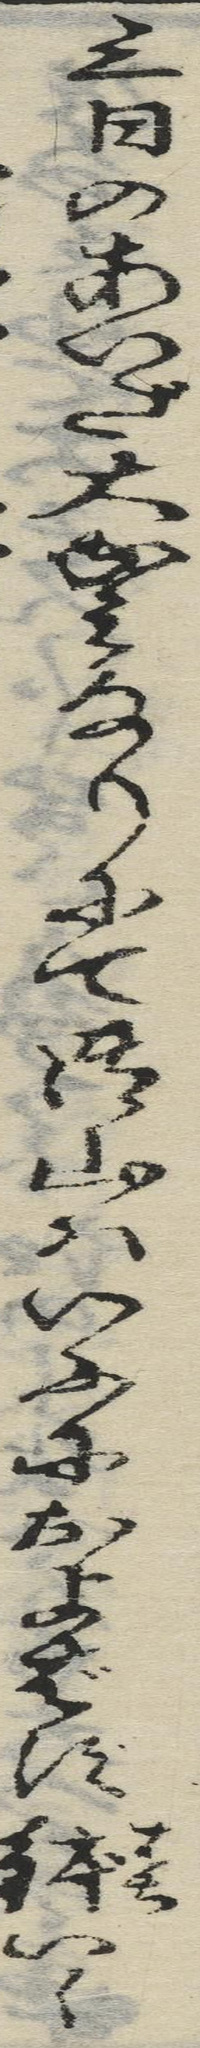三日のあいだ大かみなりにて御山はいふにおよばす鉢いし
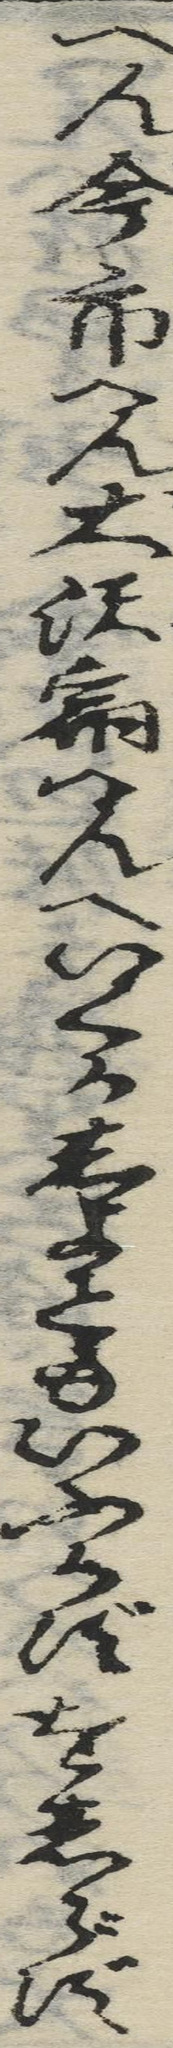へん今市へん大沢宿へんへいくかしよともいふかずをしらず
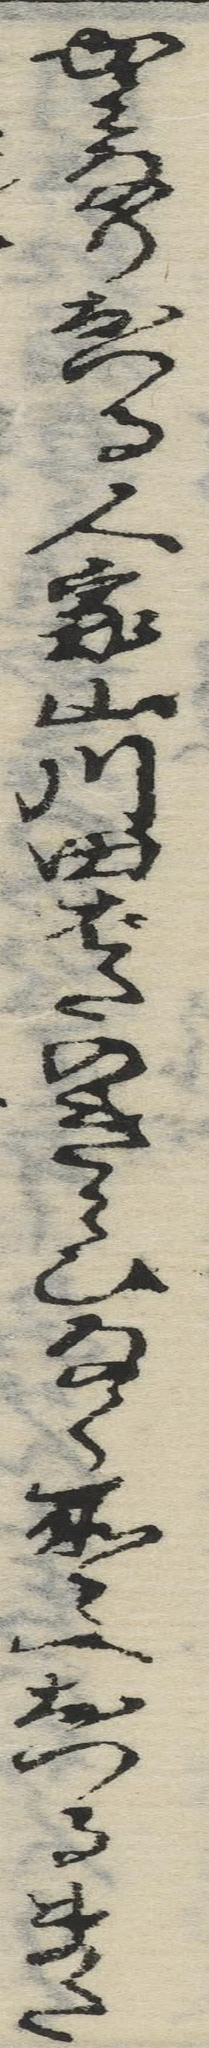かみなりおつる人家山川田ばたのきらひなく所々へおつるまた
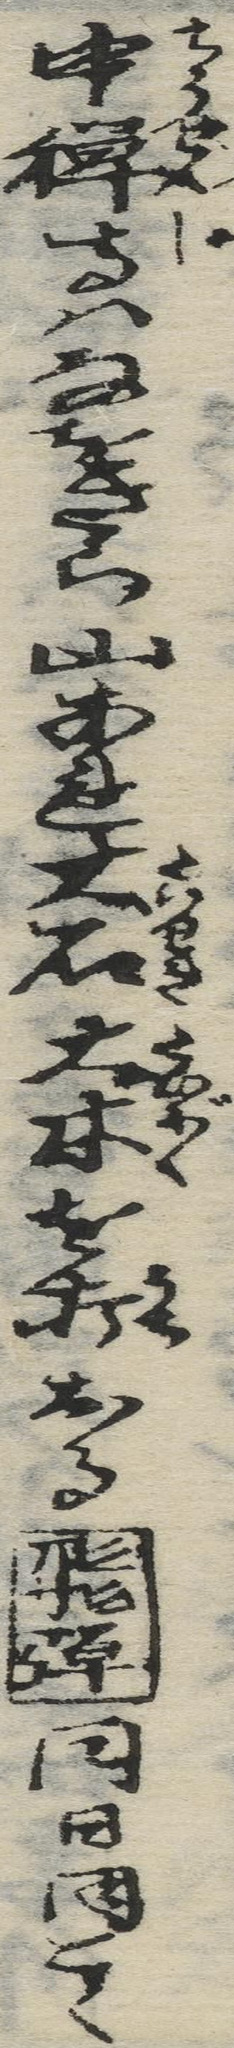中禅寺はなをさら山あれ大石大木を打おる飛騨同日同こく
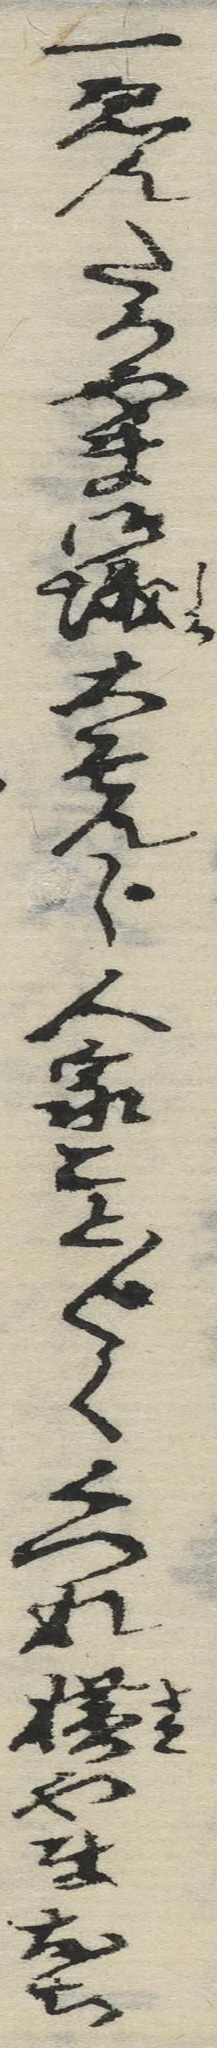一ゑんたかやま御城大そんじ人家こと〴〵くくつれ横やまおち
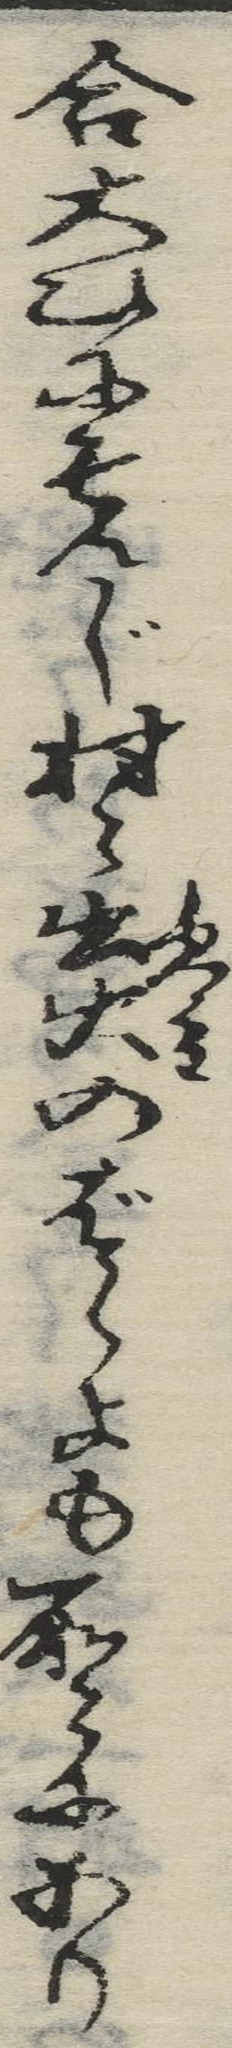合大ひにそんじ村々出火のばしよも所々にあり
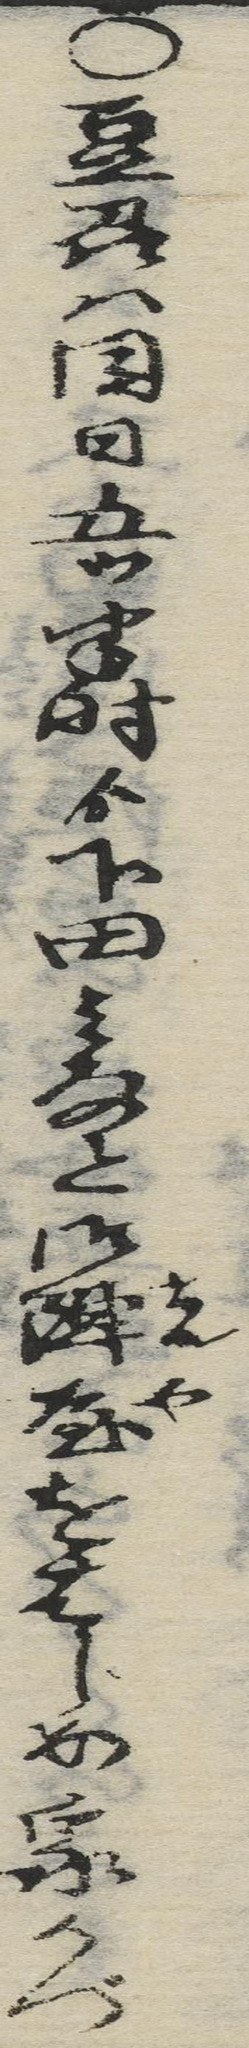◯豆州は同日五ツ半時ゟ下田みなと御陣屋をはじめ家かづ
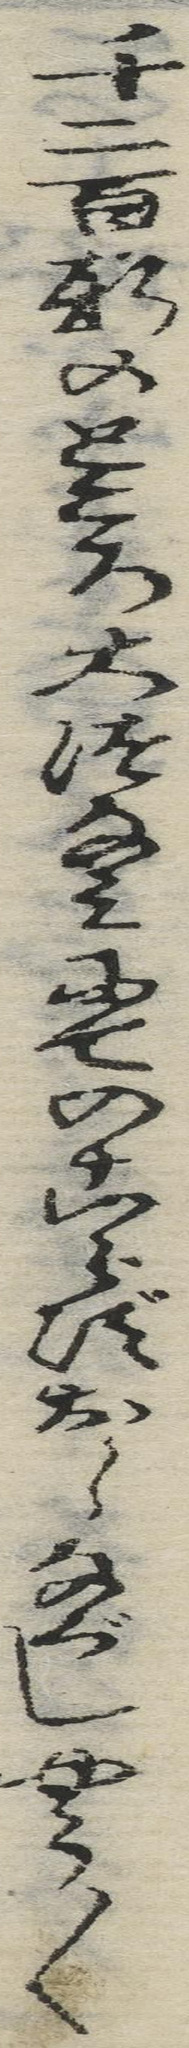千二百軒の所大つなみにてのこらずおしながしやう〳〵
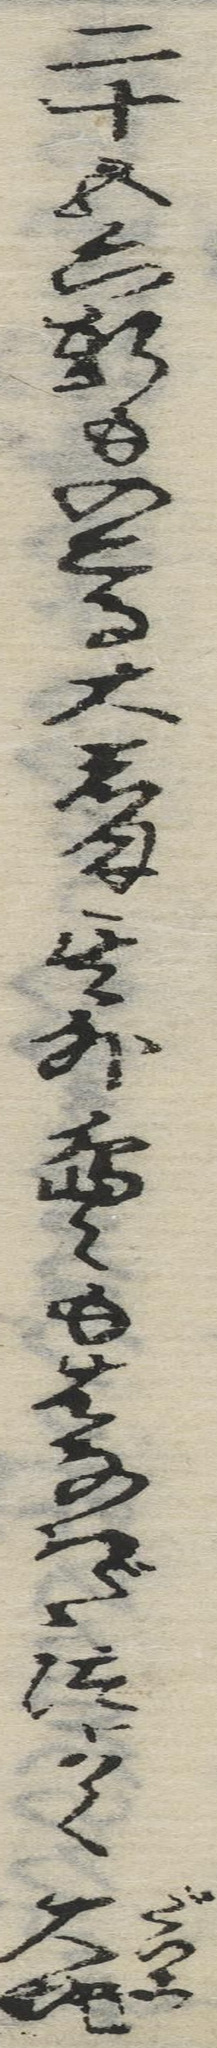二十五六軒ものこる大しま其外島々もはなはだつよく大地
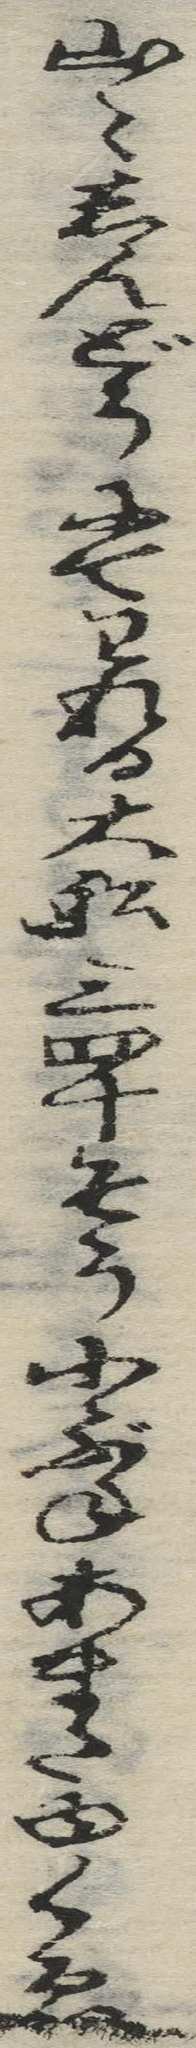山々しんどうにてわれる大船三四十そう小ぶねあまたゆくゑ
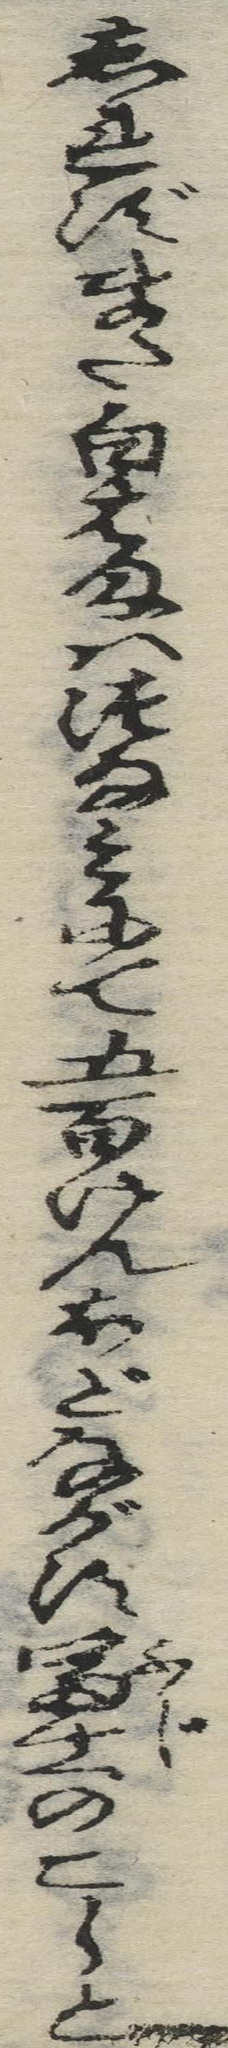しれずまた白はまはつなみにて五百けんほどながす富士のこしと

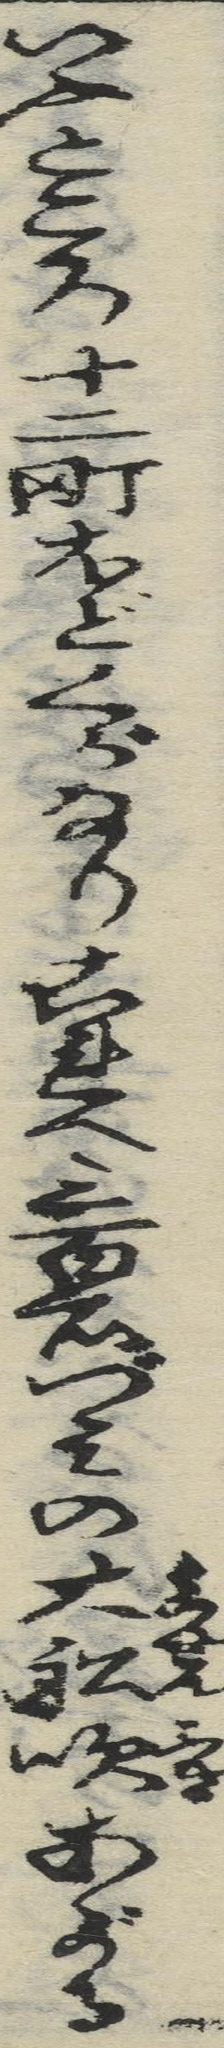いふところ十二町ほどくがなりこれへ三百石づみの大船吹あがる
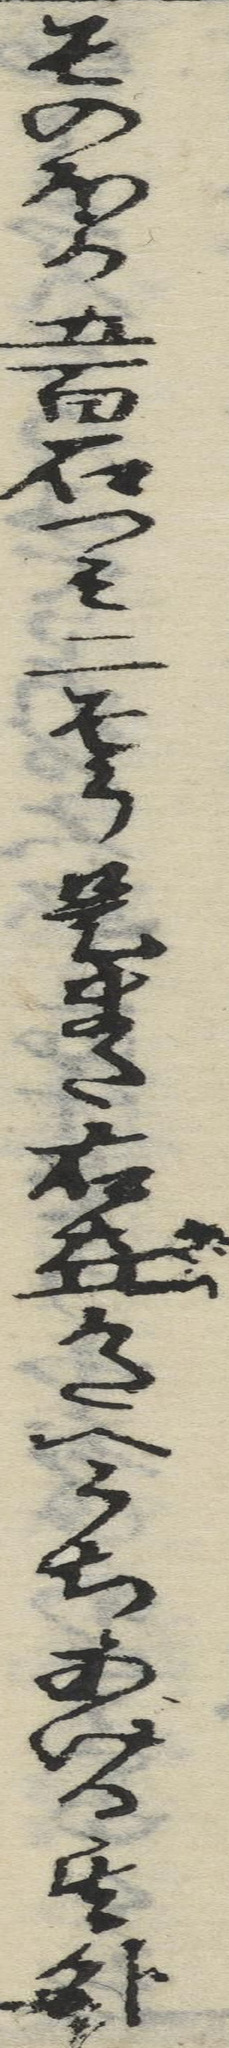そのほか五百石つみ二そう是また右在かたへうちあげる其外
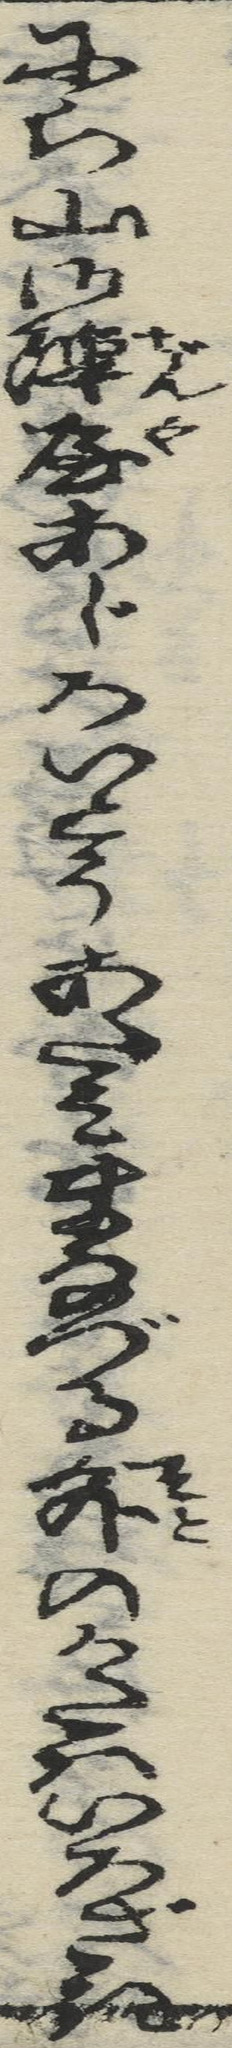にら山御陣屋あじろいとうあたみまなづる外のかたはいろざき
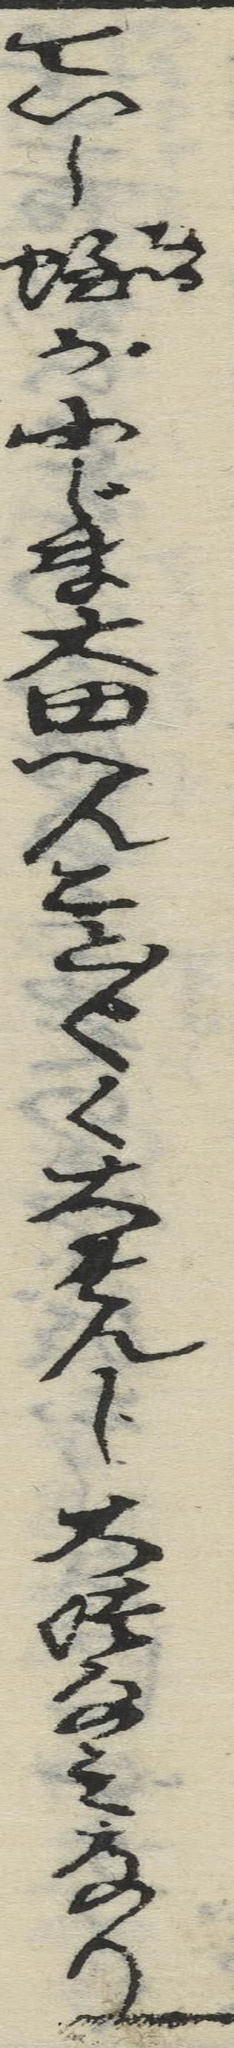ていし蛭が小じま太田へんことごとく大そんじ大つなみなり
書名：諸国海辺地震津波書
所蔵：東京大学地震研究所図書室 Earthquake Research Institute Library, The University of Tokyo, JAPAN
